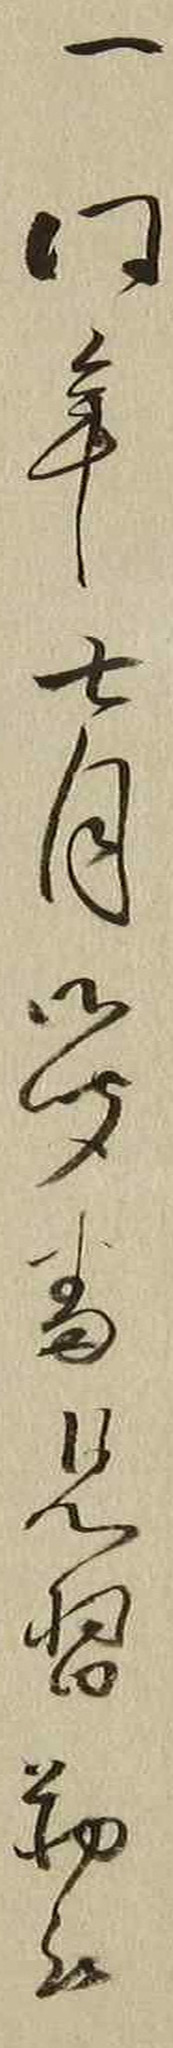一同年七月御聞番見習勤被
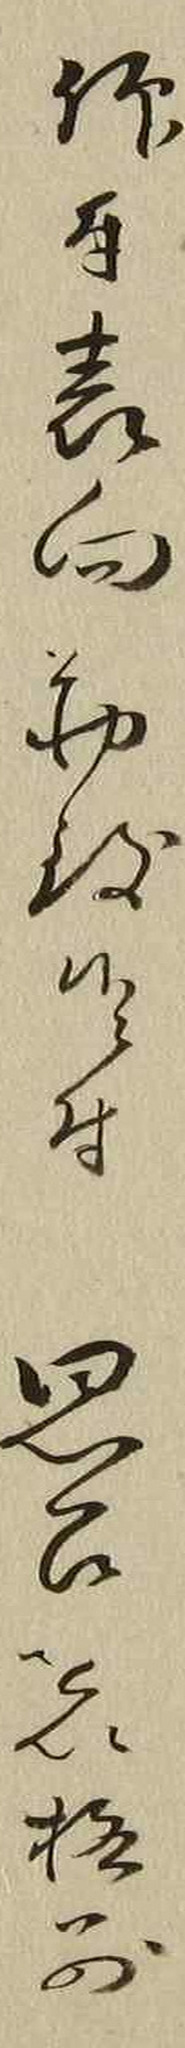仰付表向勤致候ニ付思召を以格別
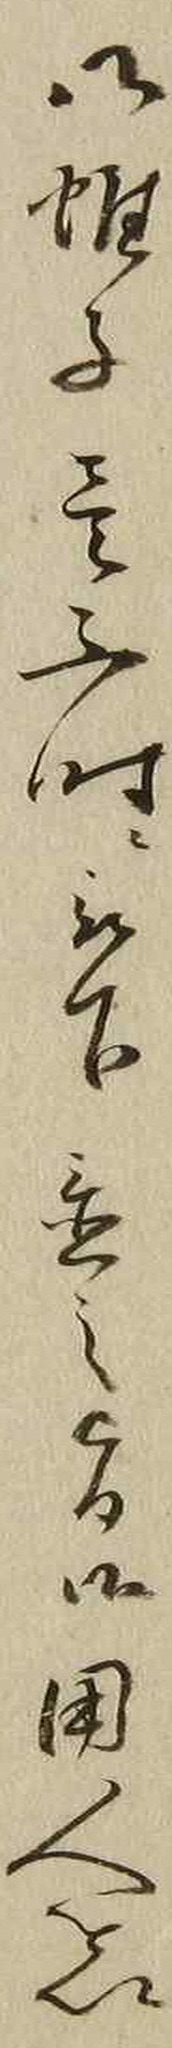御帷子壱不時ニ被下置之旨御用人を以
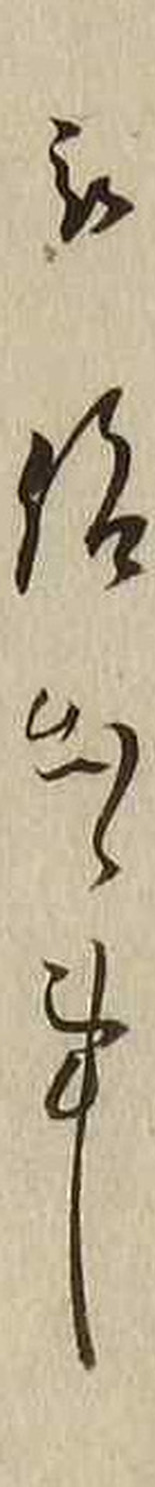被仰出候事
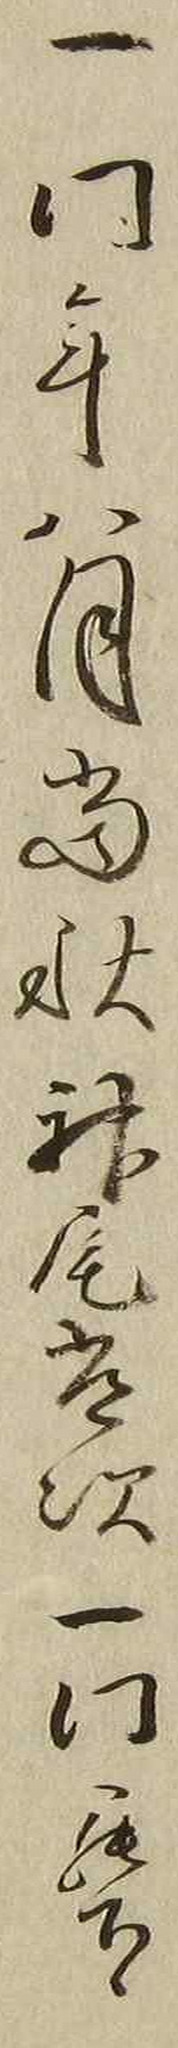一同年八月当秋神尾常次一同罷下候
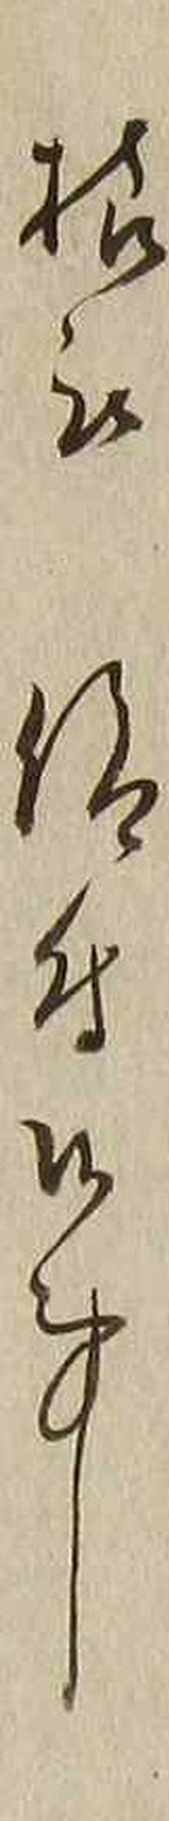様被仰付候事
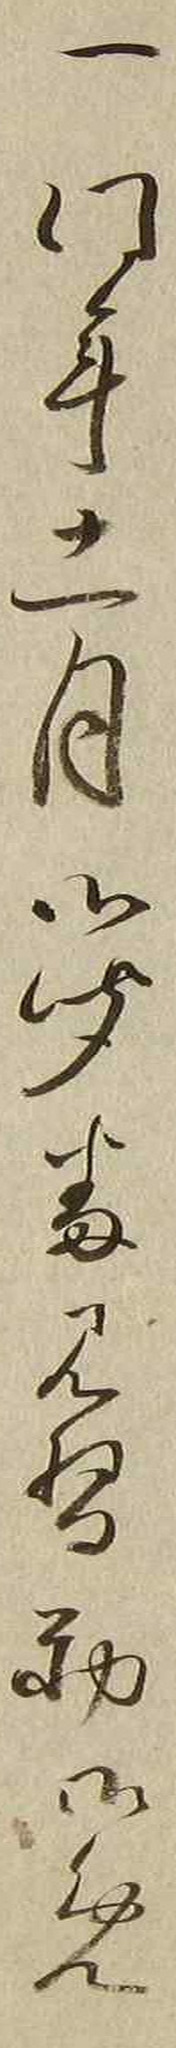一同年十一月御聞番見習勤御免
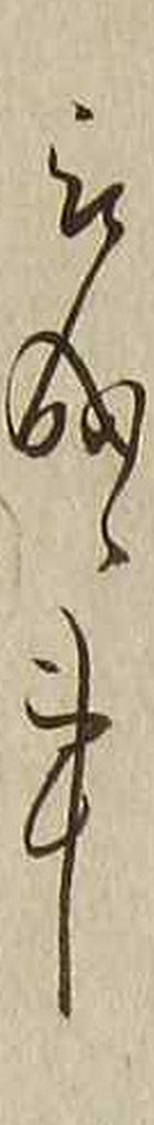被成候事
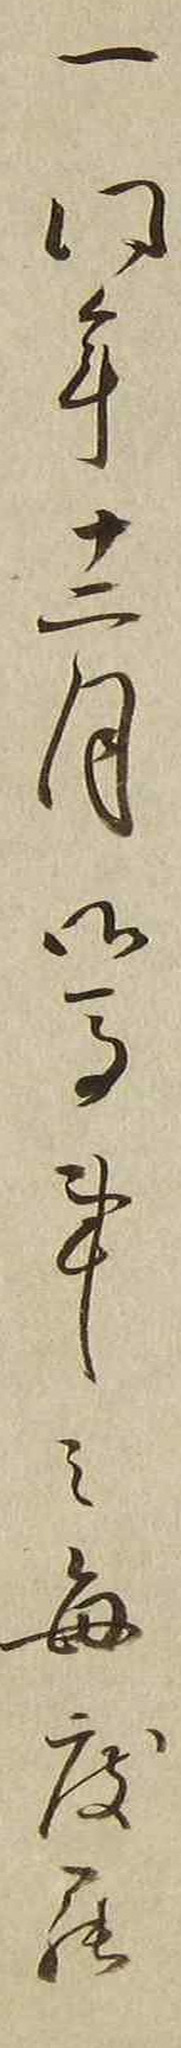一同年十二月御馬事之毎度罷
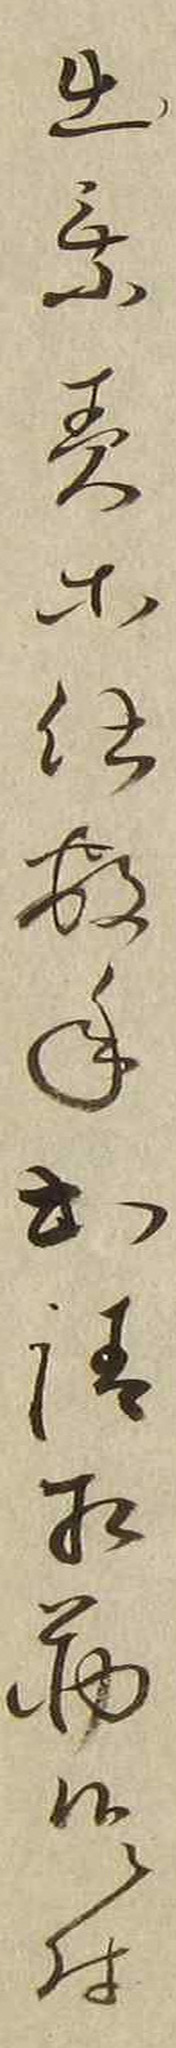出乗責等仕数年出精相勤候ニ付

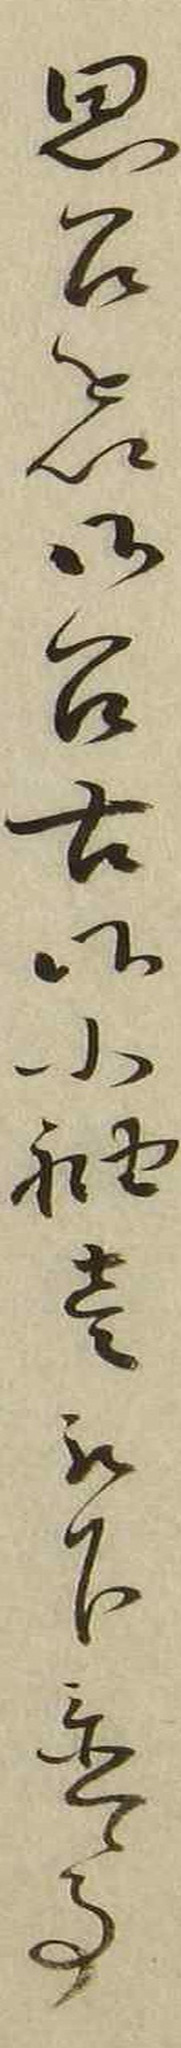思召を以御召古御小袖壱被下置候事
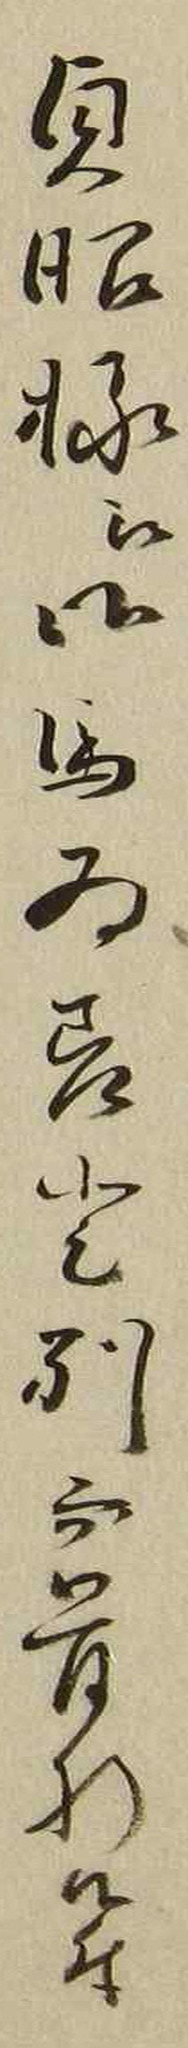貞昭様江御馬為差登別而骨折候付
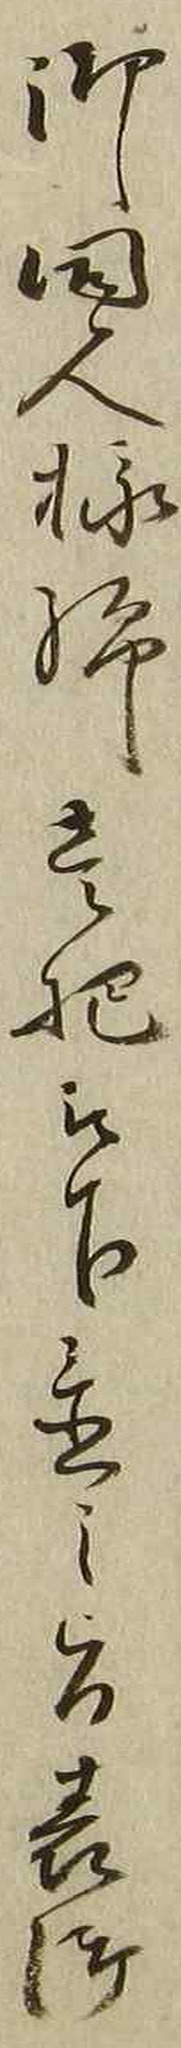御同人様綿壱把被下置之旨表御
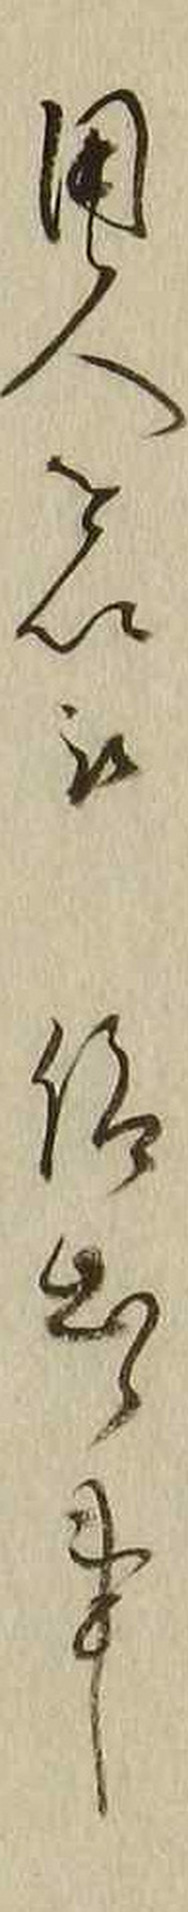用人を以被仰出候事
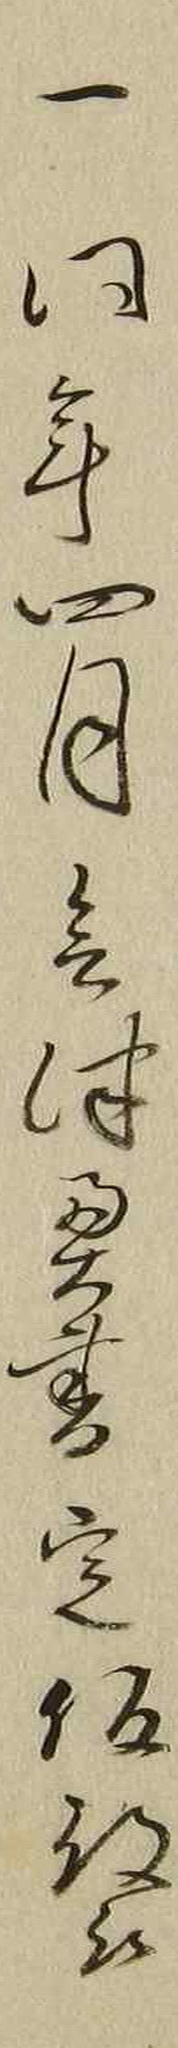一同年四月会津奥書定仮役被
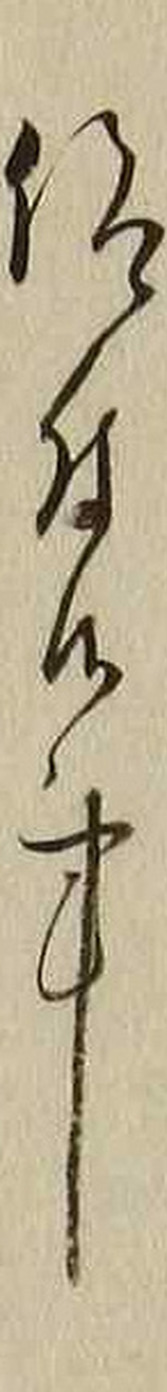仰付候事
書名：諸士系譜　巻之25　い之部25
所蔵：会津若松市立会津図書館
